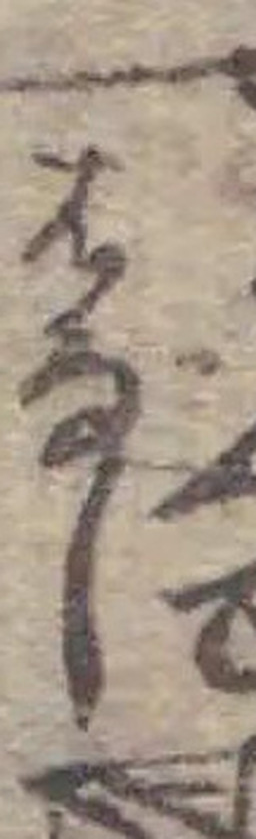はなし
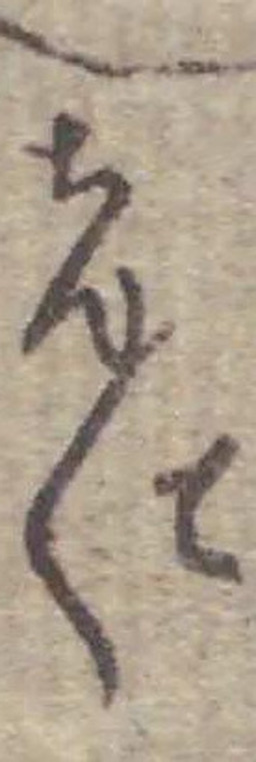ちん〳〵
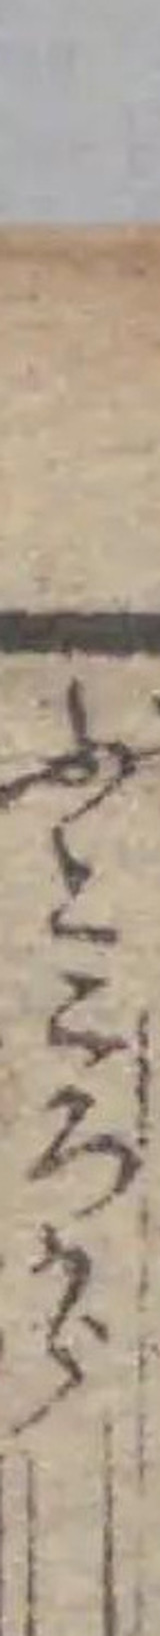ふところから
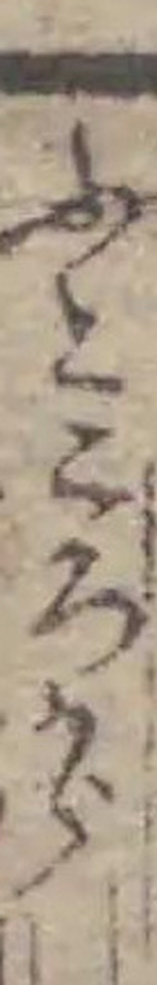ふところから
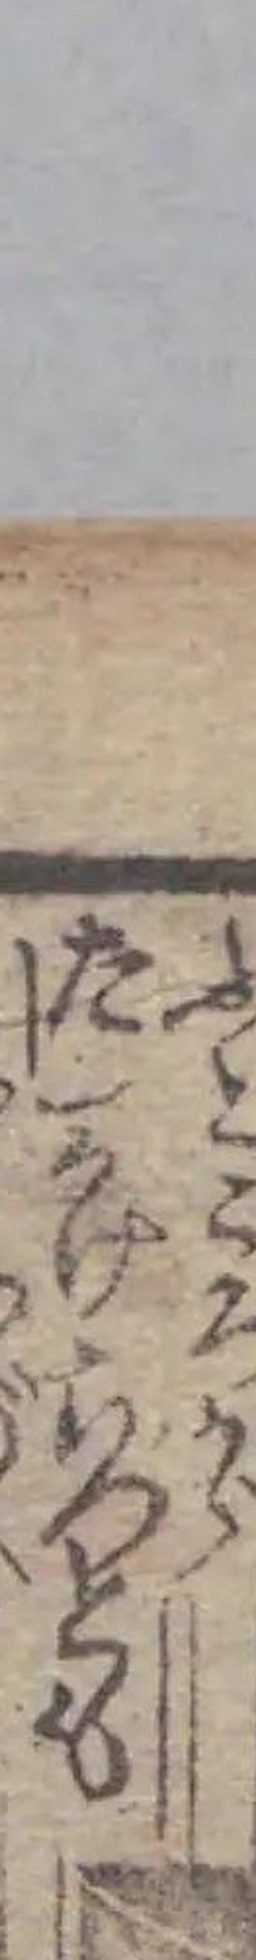たしかけちつとも
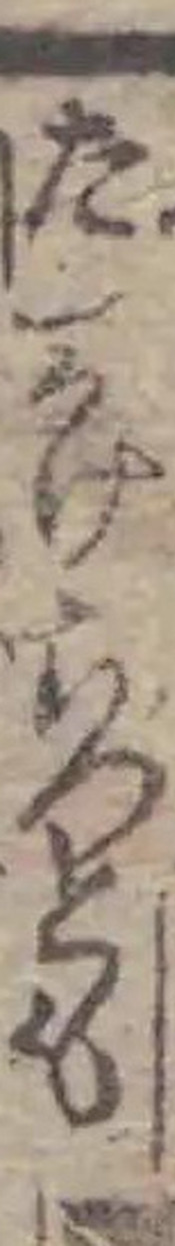たしかけちつとも
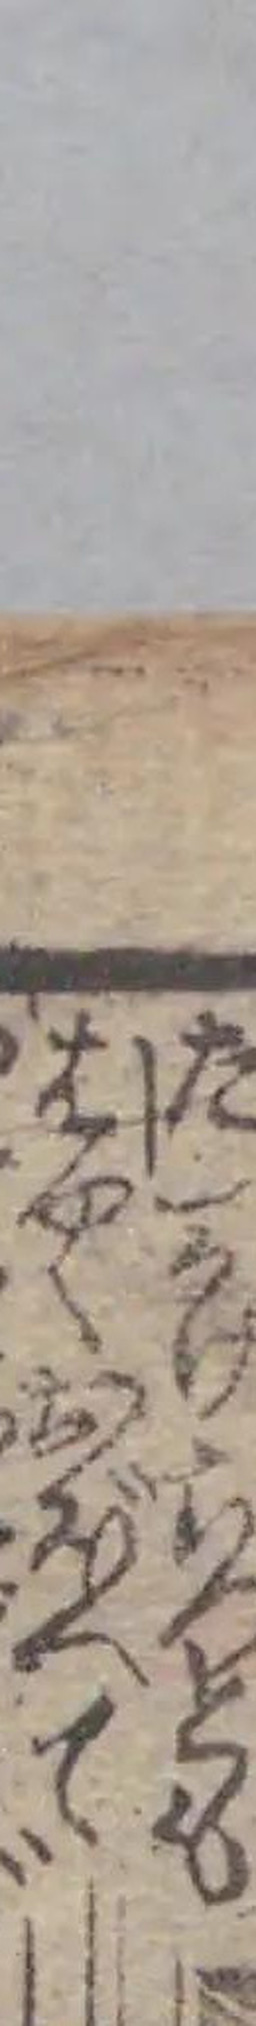はやくおぼへて
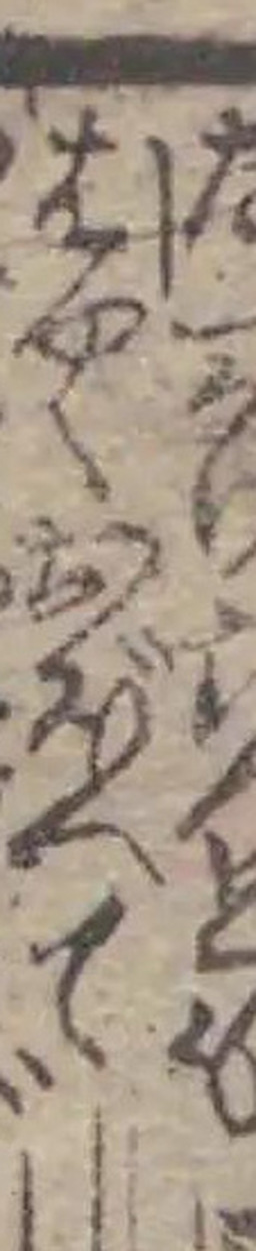はやくおぼへて
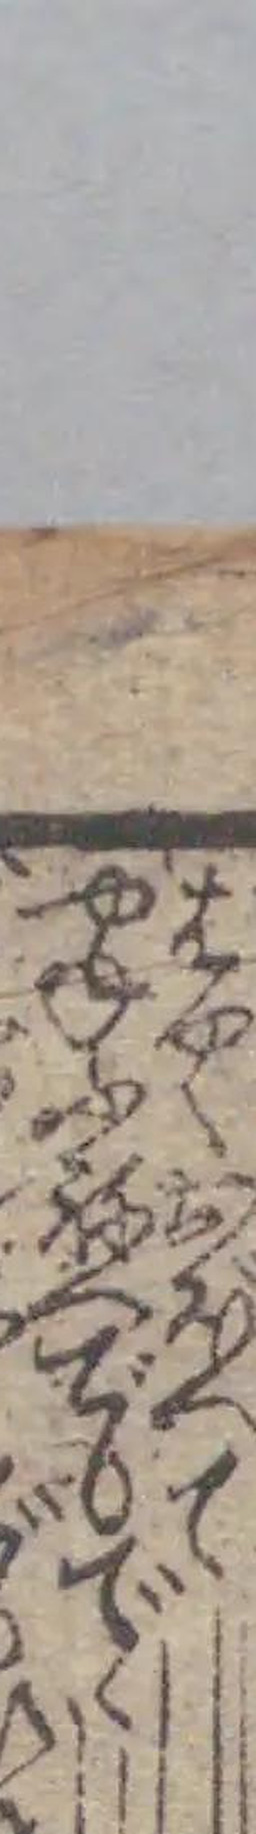やねふねへでもでゝ
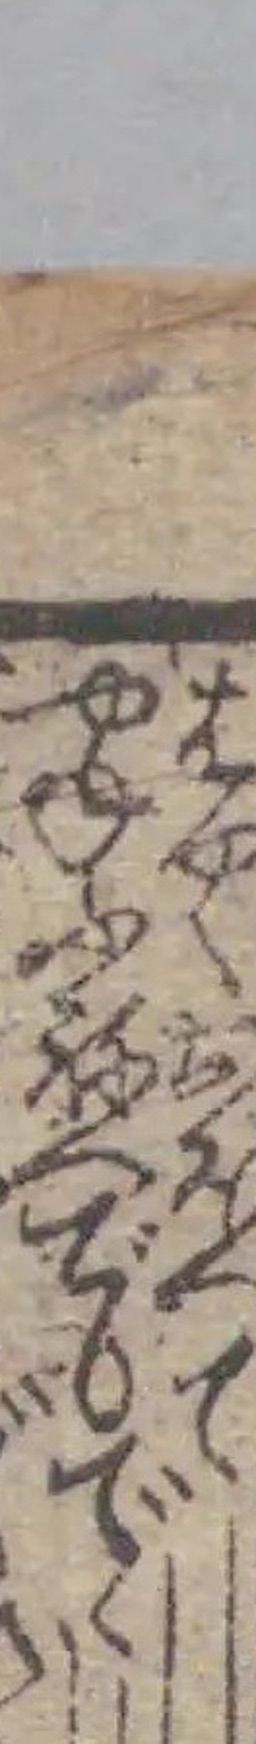やねふねへでもでゝ
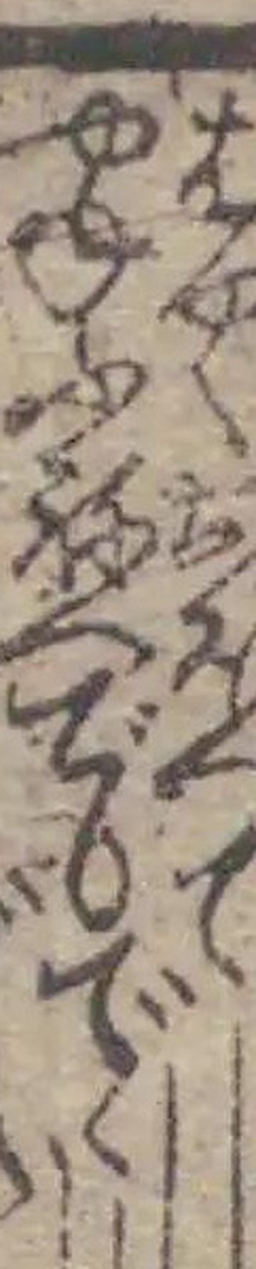やねふねへでもでゝ
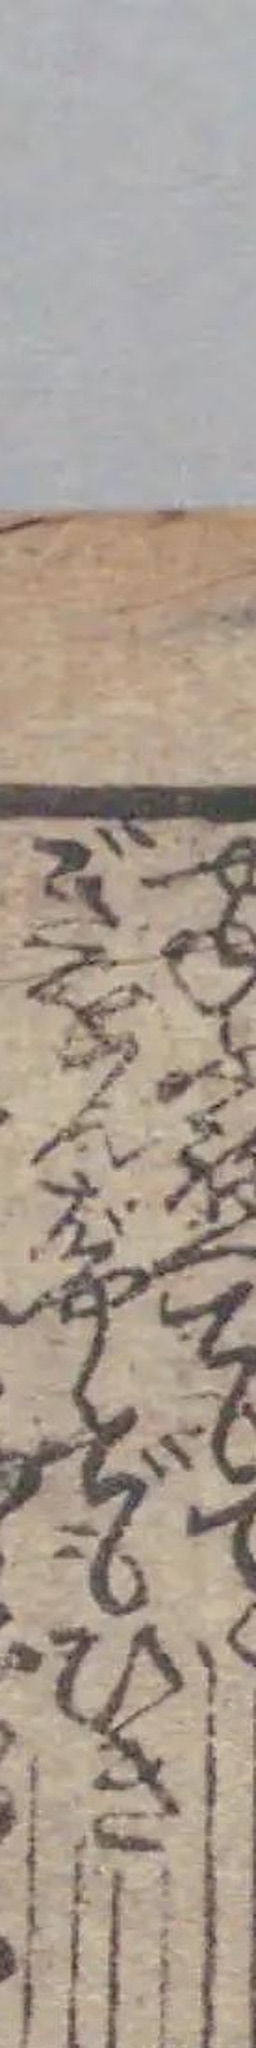ぎをんばやしでもひき
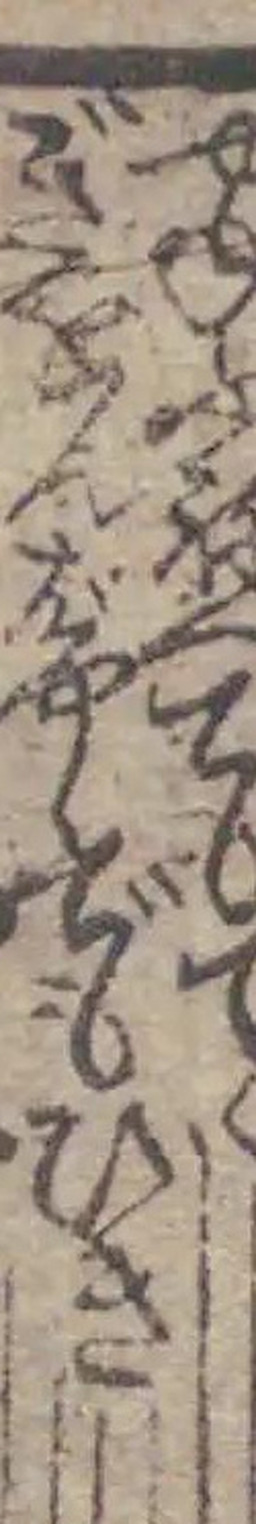ぎをんばやしでもひき
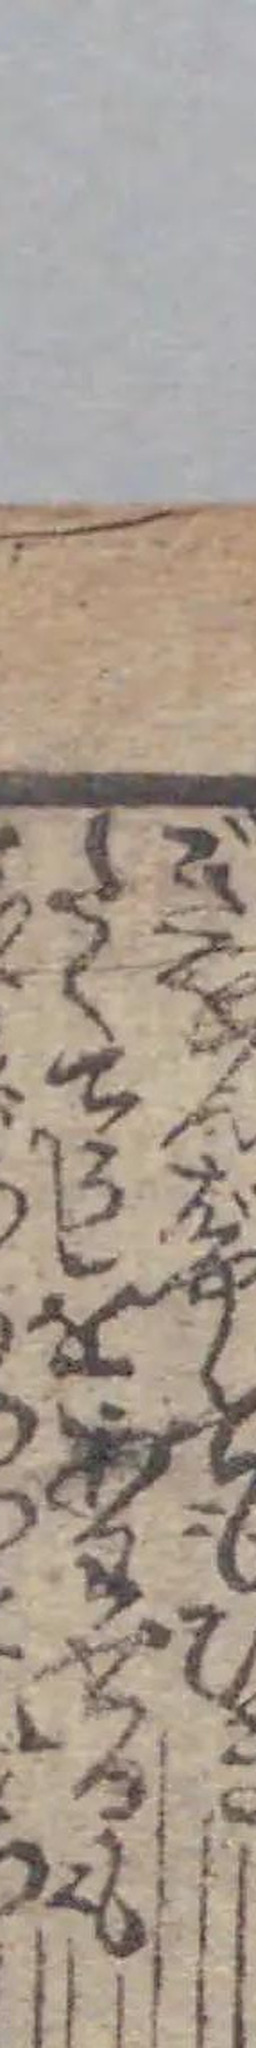たくてうしをあわせるも
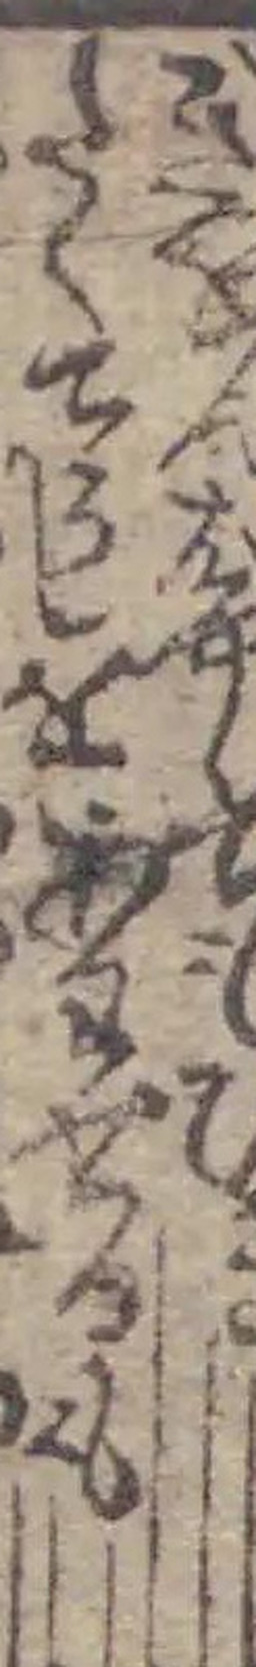たくてうしをあわせるも
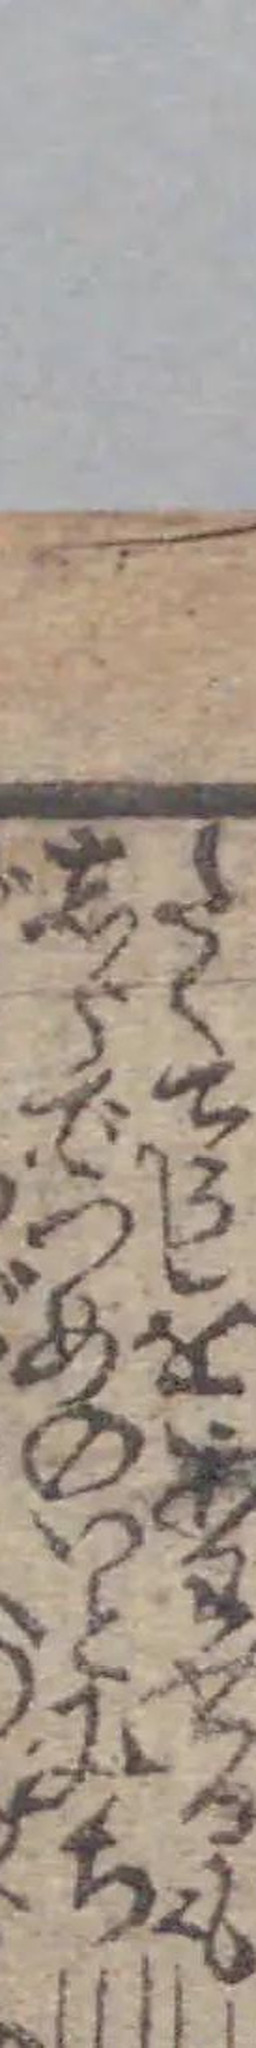しらでつめのいとみち
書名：津以曽無弟の甚六 3巻
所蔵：国立国会図書館 National Diet Library, JAPAN
